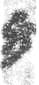易（狄）
